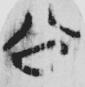公
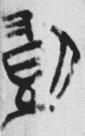○（豈）
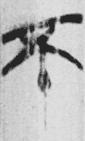不
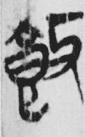○（飽）
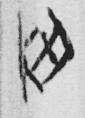梁（粱）
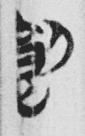飤（食）
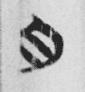肉
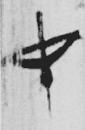才（哉）
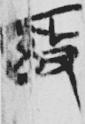殹（繄）
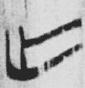亡（無）
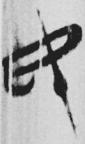女（如）
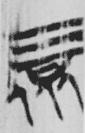○（庶）
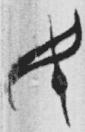民
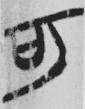可（何）
